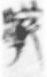鞁
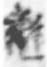○（轡）
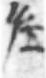差（左）
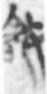○（令）
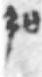弘
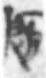所
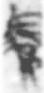馭（御）
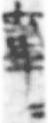騬
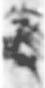雘
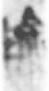輪
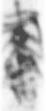○（畫）
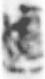○（轅）
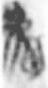弼
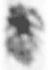○（畫）
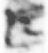○（圓）
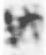軒
